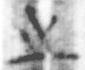之
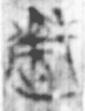○（衡）
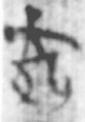戹（軛）
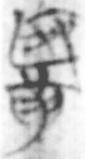○（緅）
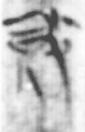敗
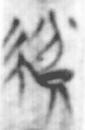○（紛）
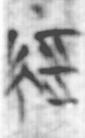經
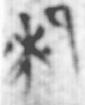○（漆）
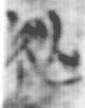紳（靷）
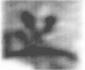之
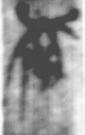紫
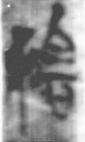○（組）
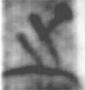之
